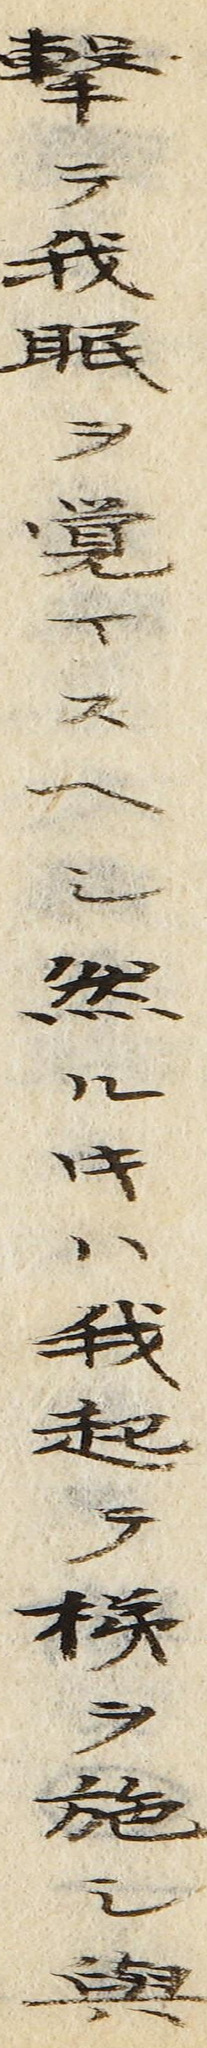撃テ我眠ヲ覚マスヘシ然ルトキハ我起テ梯ヲ施シ与
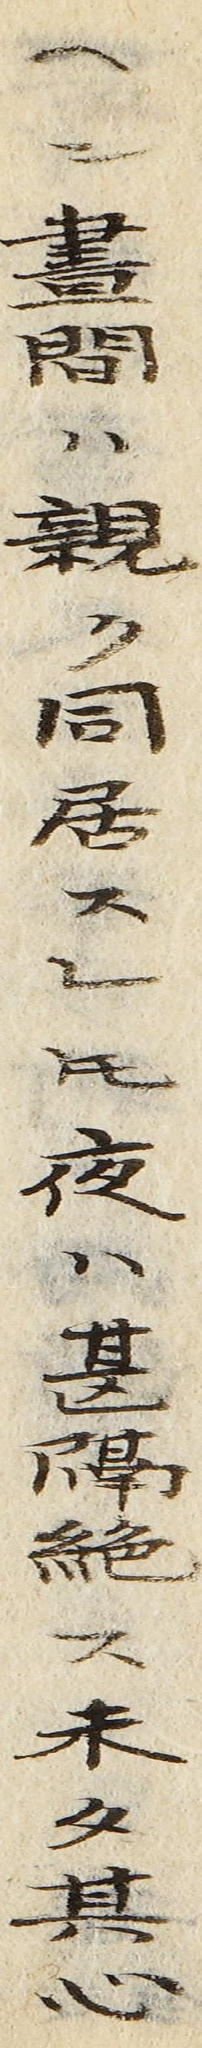ヘン昼間ハ親ク同居スレトモ夜ハ甚隔絶ス未タ其心
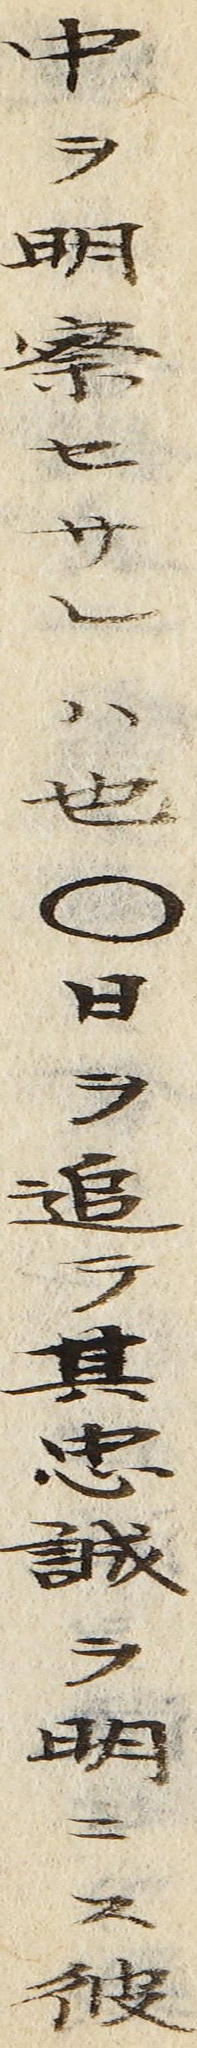中ヲ明察セサレハ也◯日ヲ追テ其忠誠ヲ明ニス彼
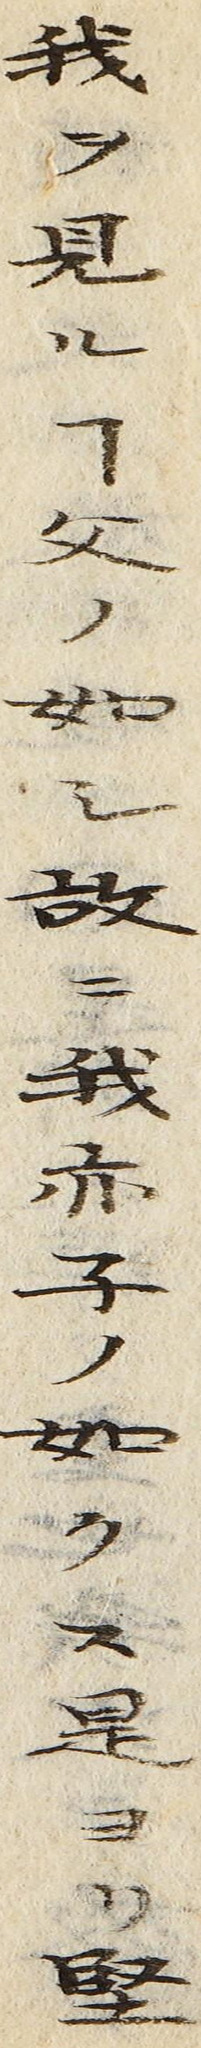我ヲ見ルコト父ノ如シ故ニ我亦子ノ如ク是ヨリ堅
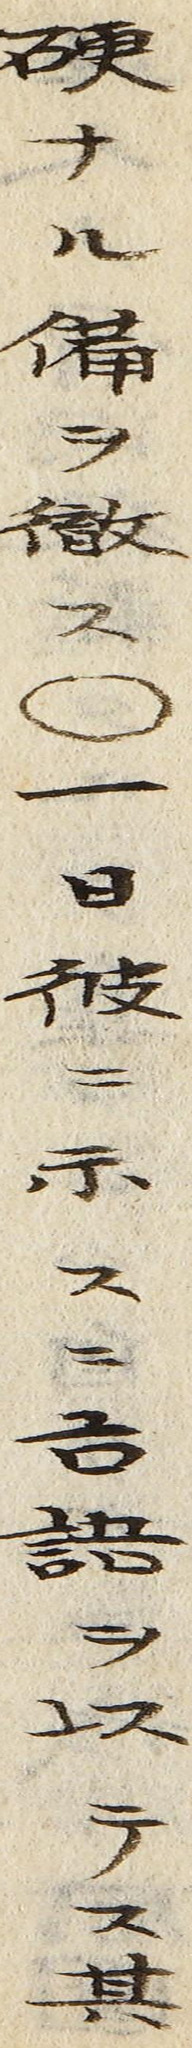硬ナル備ヲ徹ス◯一日彼ニ示スニ吾語ヲ以テス其
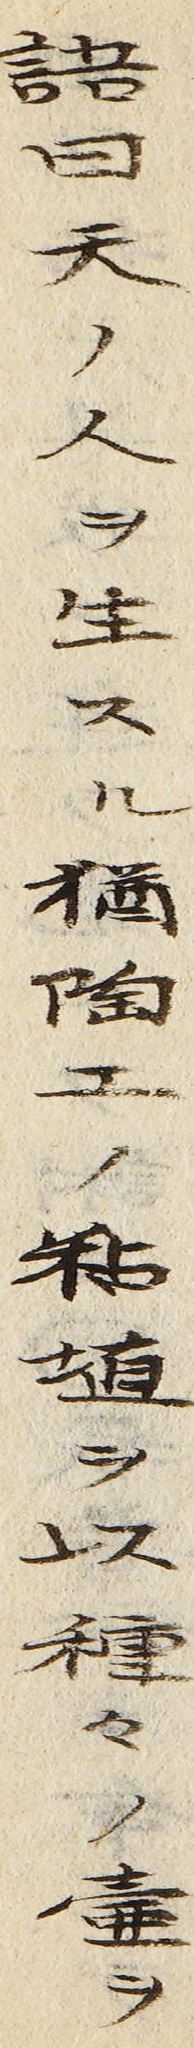語曰天ノ人ヲ生スル猶陶工ノ粘埴ヲ以種々ノ壺ヲ
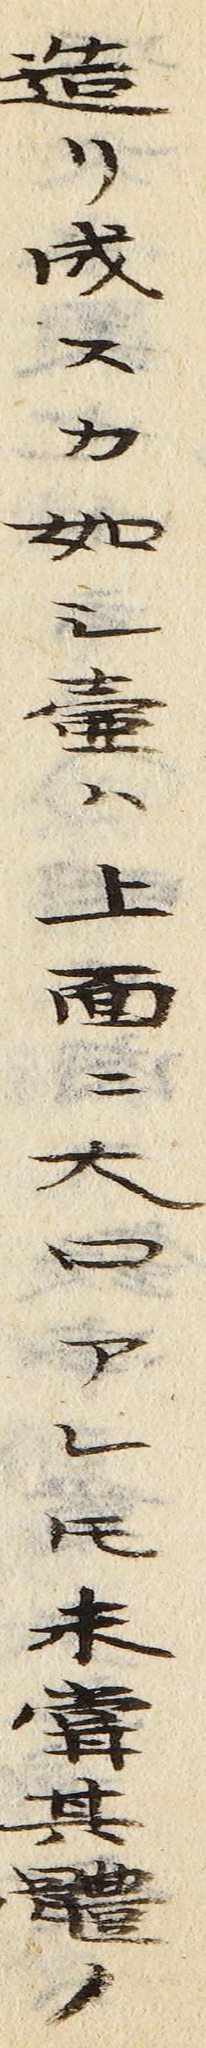造リ成スカ如シ壺ハ上面ニ大口アレトモ未嘗其体ノ
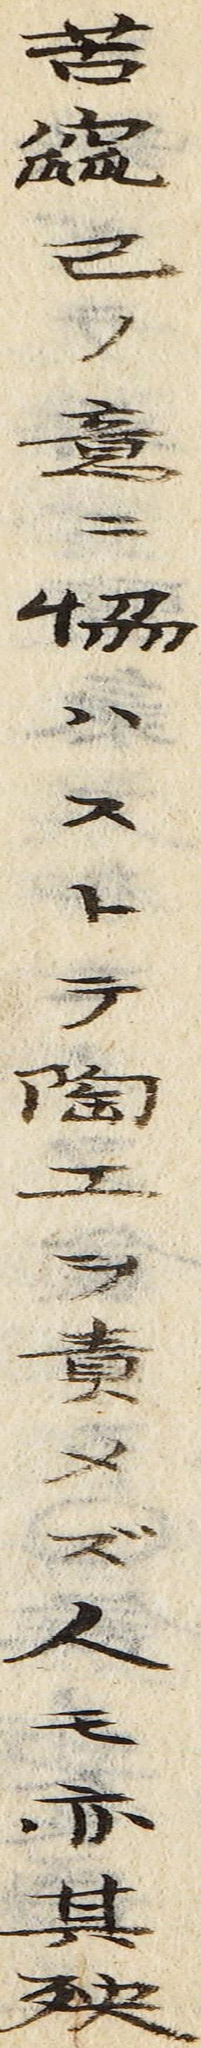苦窳己ノ意ニ協ハストテ陶工ヲ責メズ人モ亦其殃
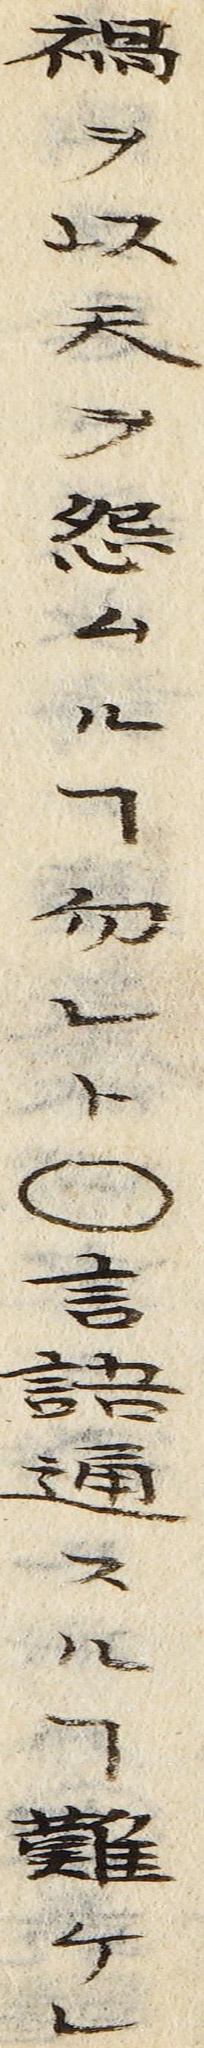禍ヲ以天ヲ怨ムルコト勿レト◯言語通スルコト難ケレ
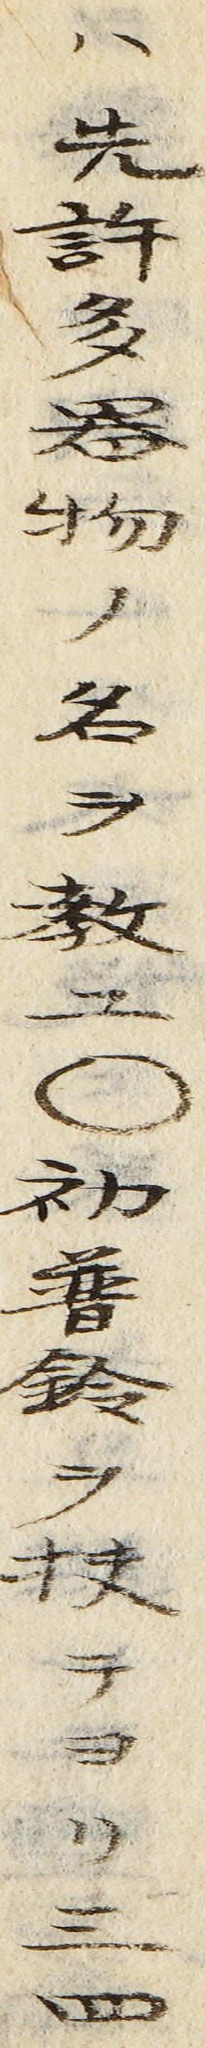ハ先許多器物ノ名ヲ教ユ◯初普鈴ヲ扶テヨリ三四
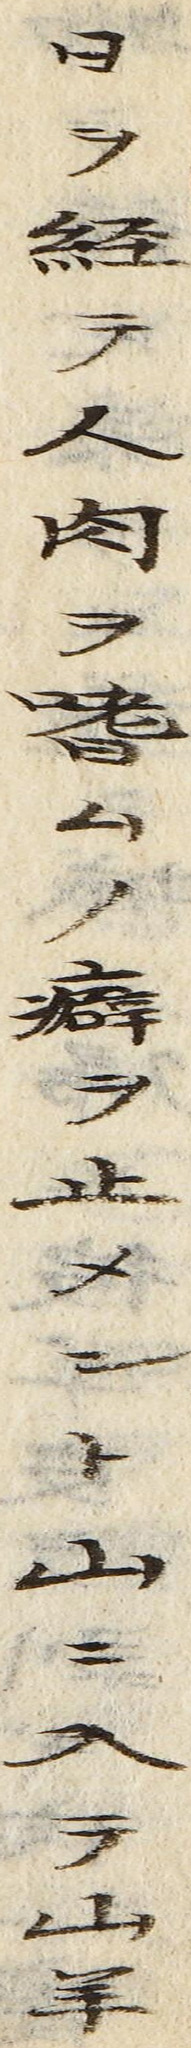日ヲ経テ人肉ヲ嗜ムノ癖ヲ止メント山ニ入テ山羊
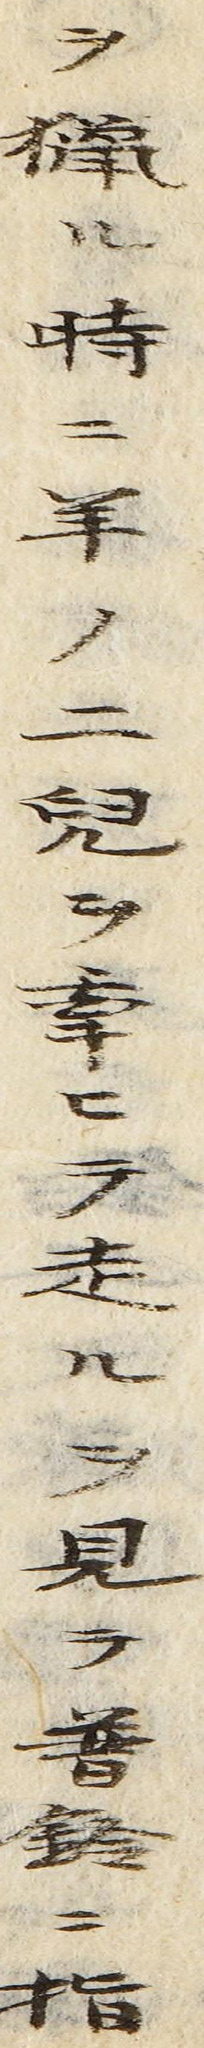ヲ猟ル時ニ羊ノ二児ヲ牽ヒテ走ルヲ見テ普鈴ニ指
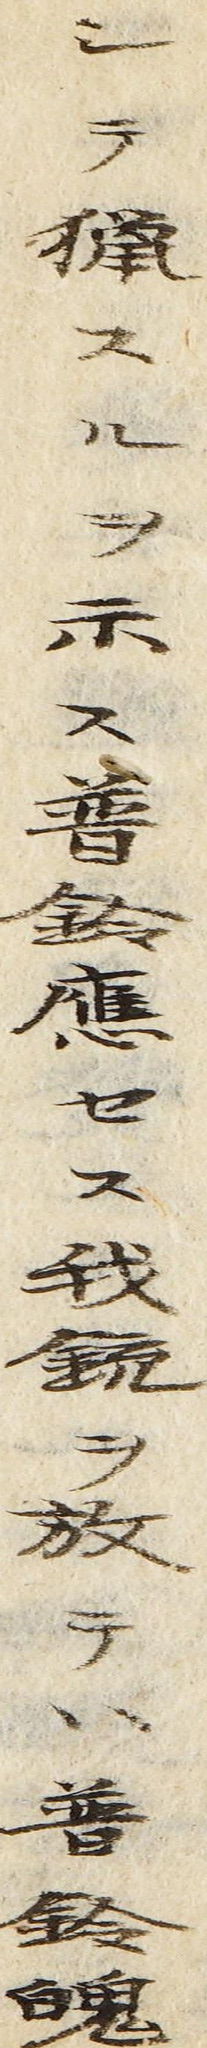シテ猟スルヲ示ス普鈴応セス我銃ヲ放テハ普鈴魄
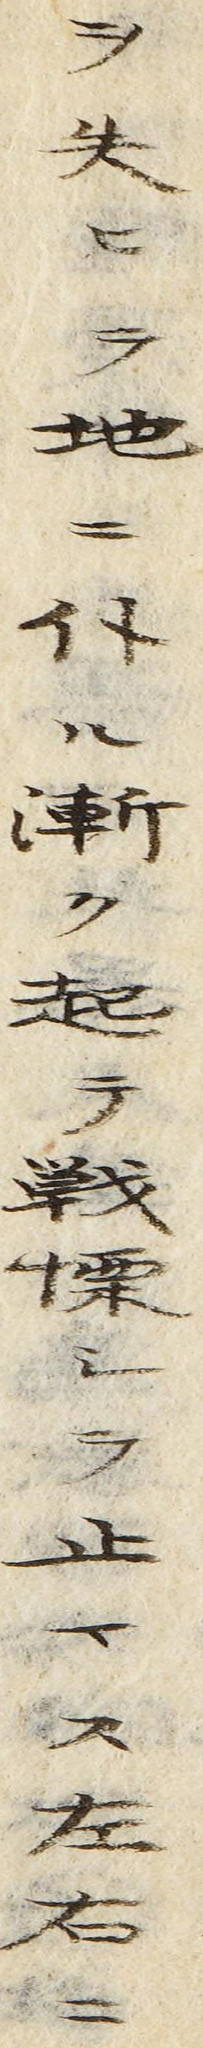ヲ失ヒテ地ニ仆ル漸ク起テ戦慄シテ止マス左右ニ
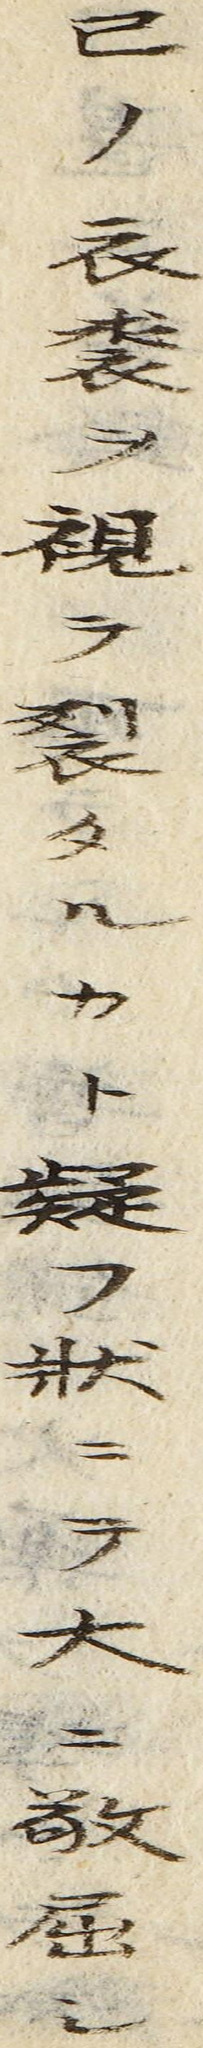己ノ衣裘ヲ視テ裂タルカト疑フ状ニテ大ニ敬屈シ
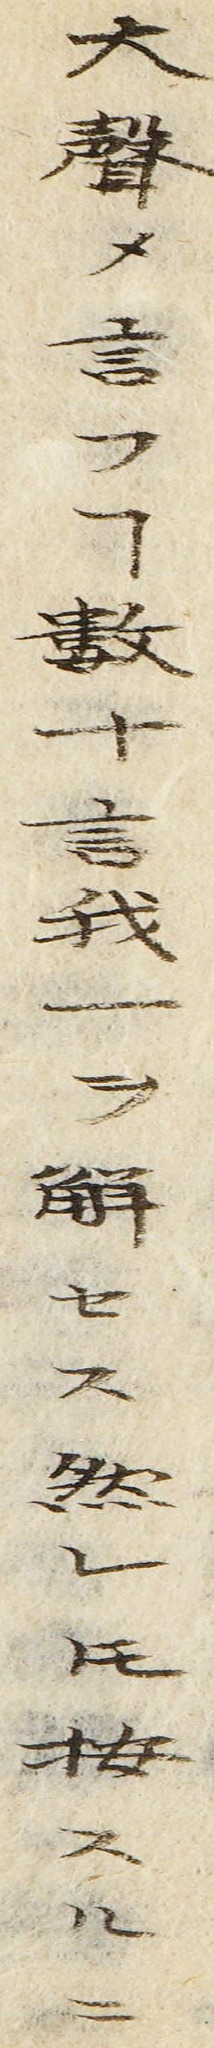大声シテ言フコト数十言我一ヲ解セス然レトモ按スルニ
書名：漂流紀事
